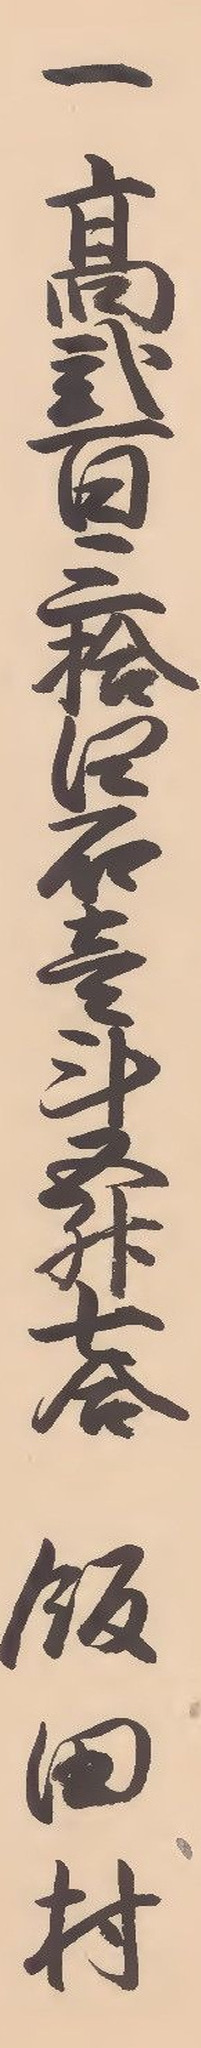一高弐百三拾四石壱斗五升七合飯田村
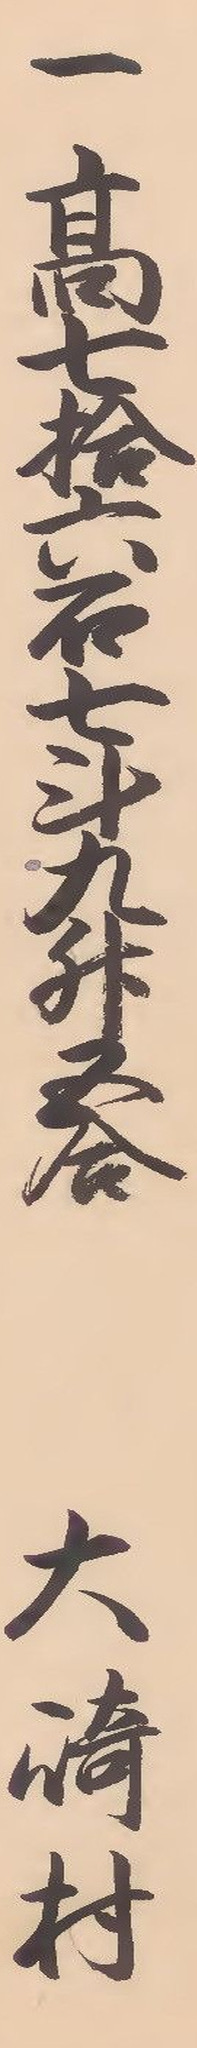一高七拾六石七斗九升五合大崎村

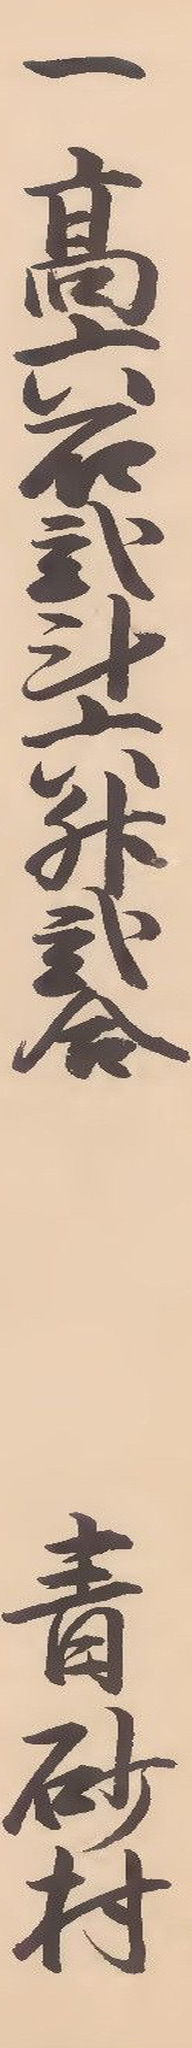一高六石弐斗六升弐合青砂村
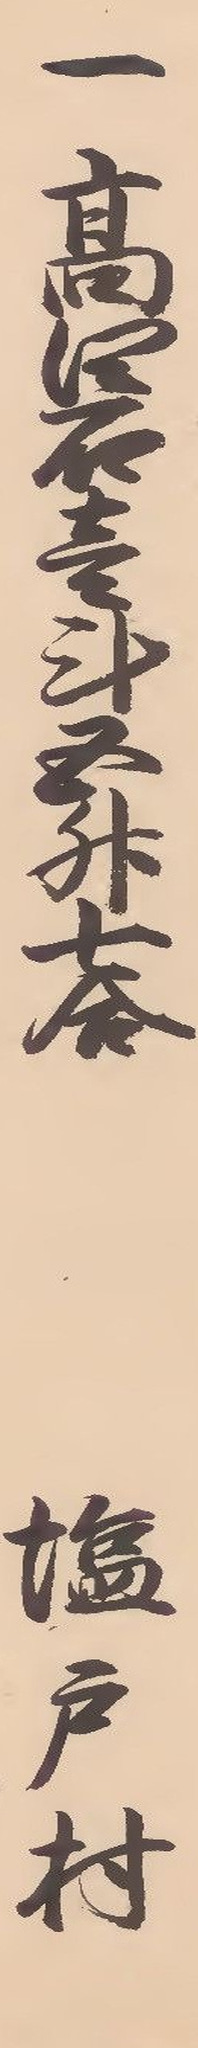一高四石壱斗五升七合塩戸村
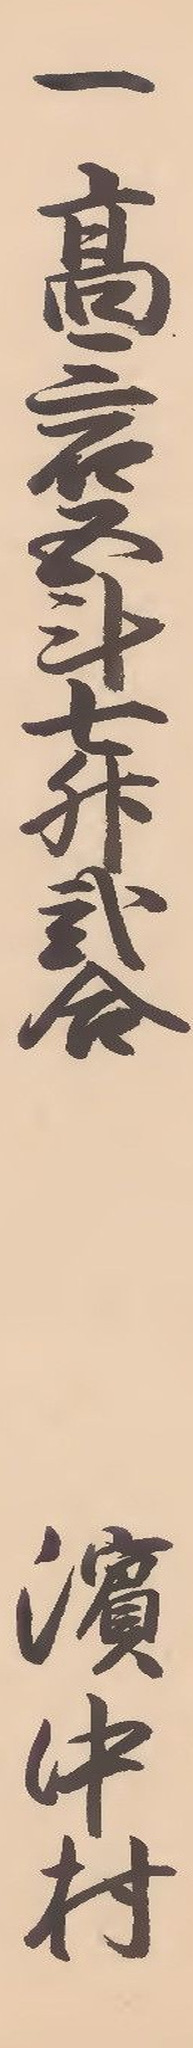一高三石五斗七升弐合浜中村
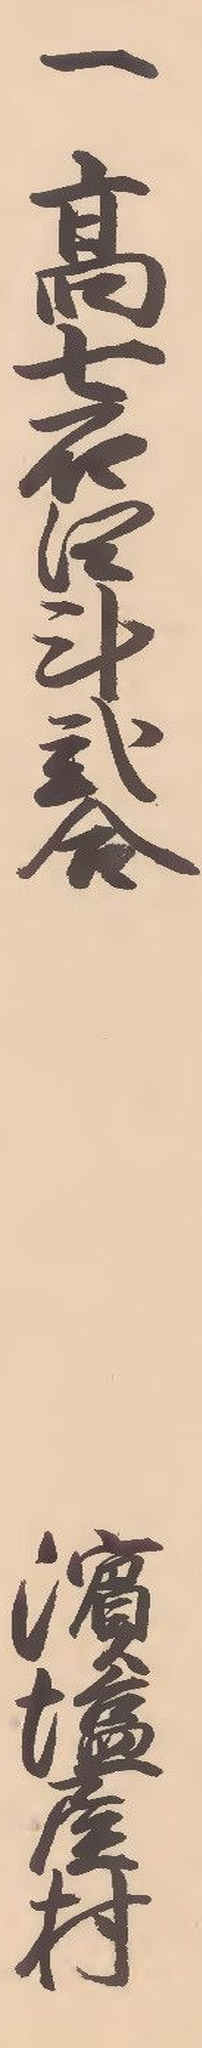一高七石四斗弐合浜塩屋村
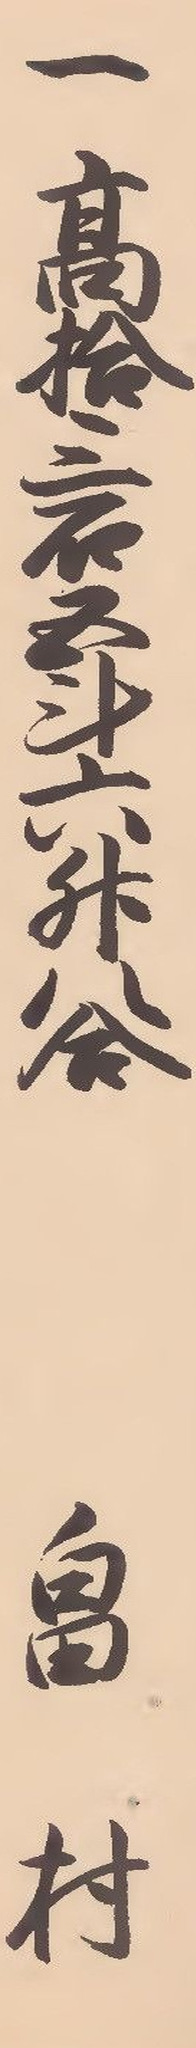一高拾三石五斗六升八合畠村
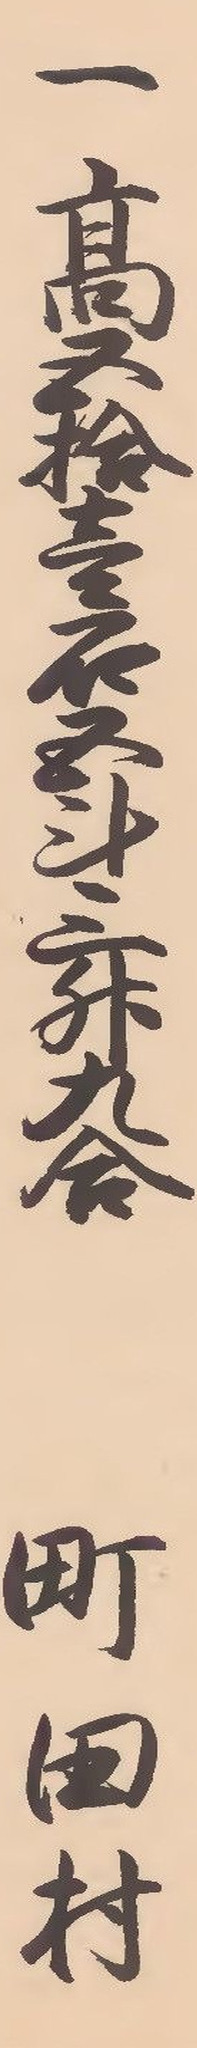一高五拾壱石五斗三升九合町田村
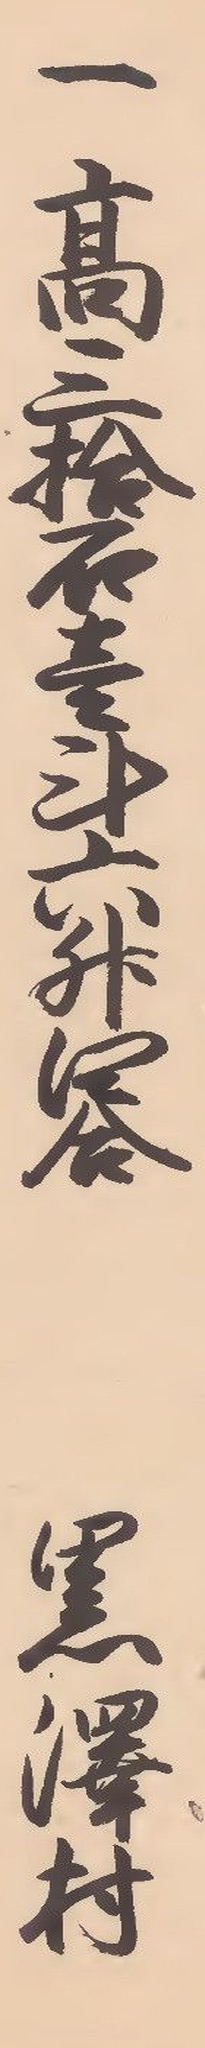一高三拾石壱斗六升四合黒沢村
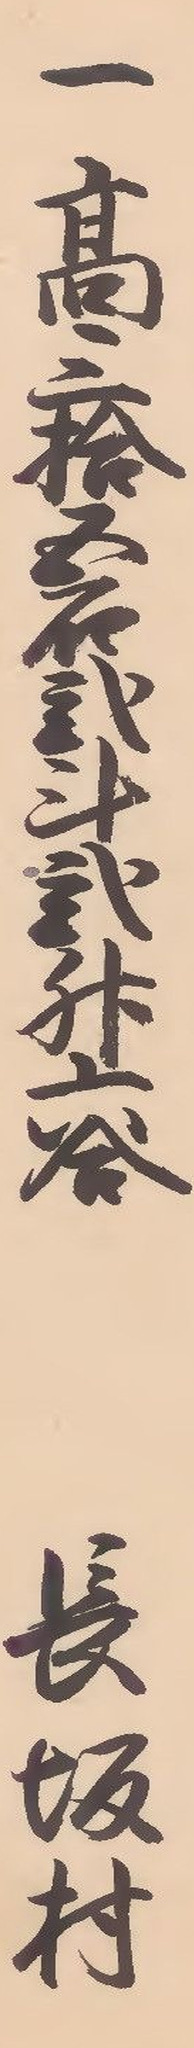一高三拾五石弐斗弐升六合長坂村

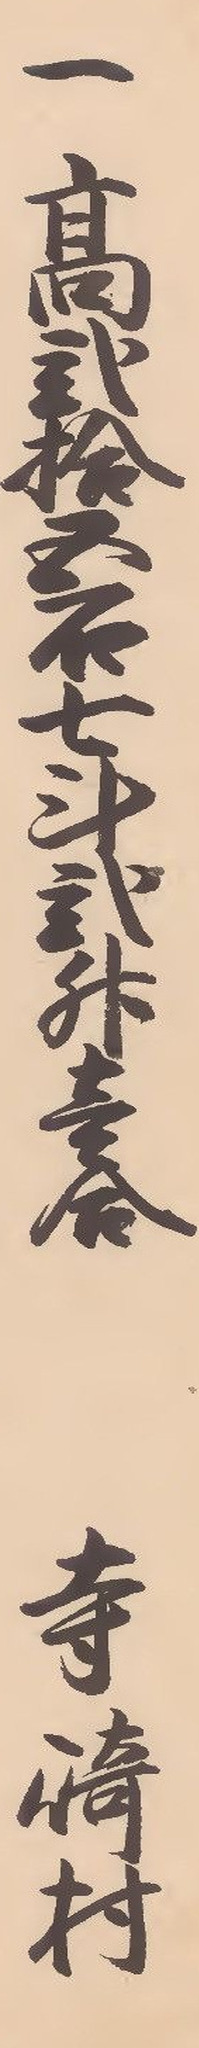一高弐拾五石七斗弐升壱合寺崎村
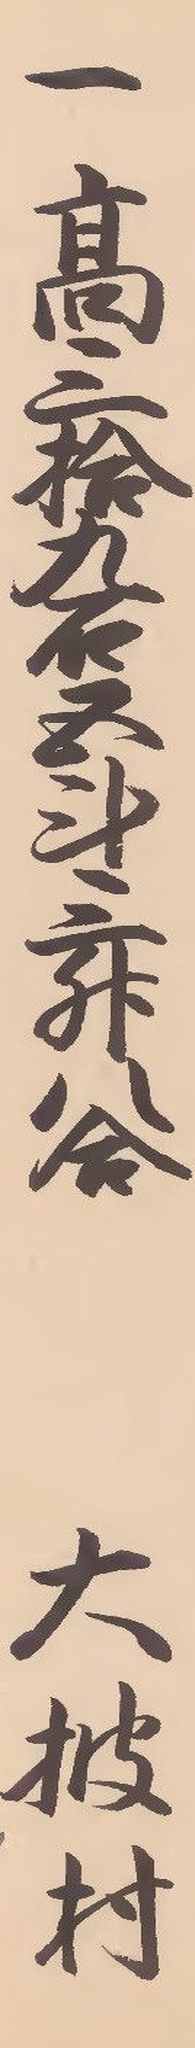一高三拾九石五斗三升八合大披村
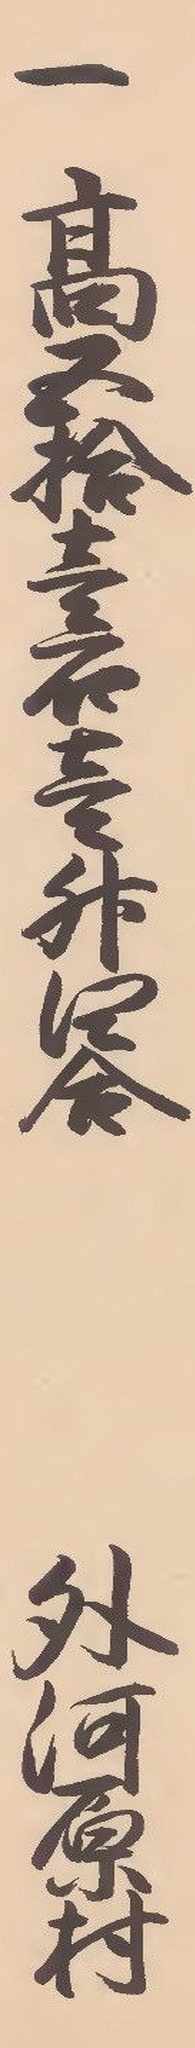一高五拾壱石壱升四合外河原村
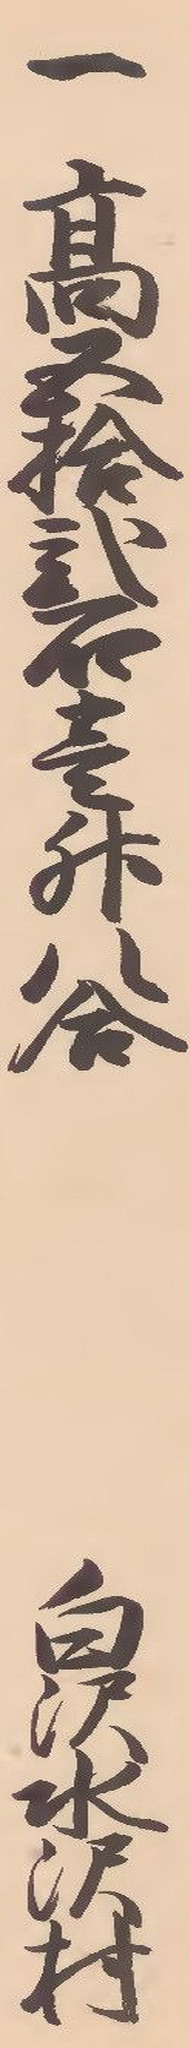一高五拾弐石壱升八合白沢水沢村
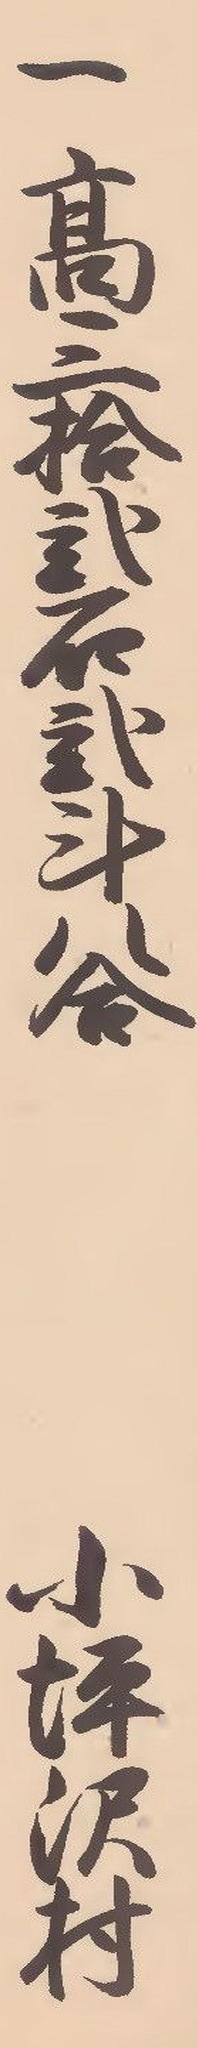一高三拾弐石弐斗八合小坪沢村
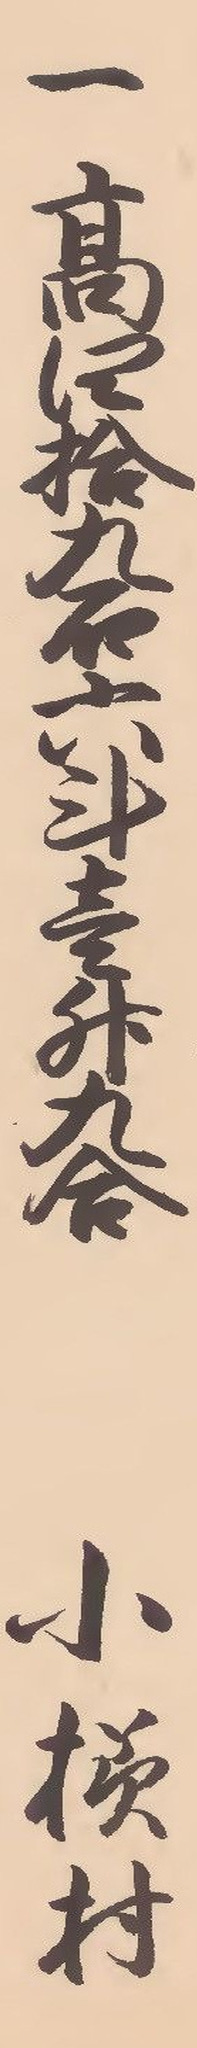一高四拾九石六斗壱升九合小様村
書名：出羽国郷帳　５
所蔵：国立公文書館 National Archives of Japan
